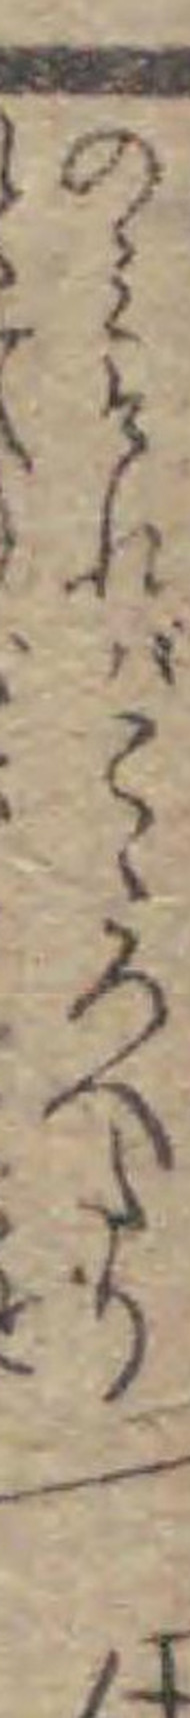のみければこゝろへたり
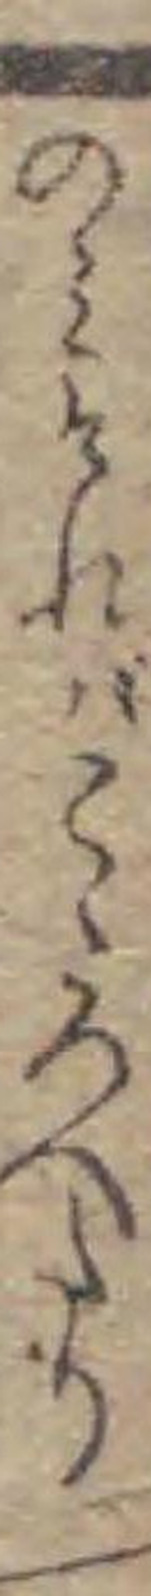のみければこゝろへたり
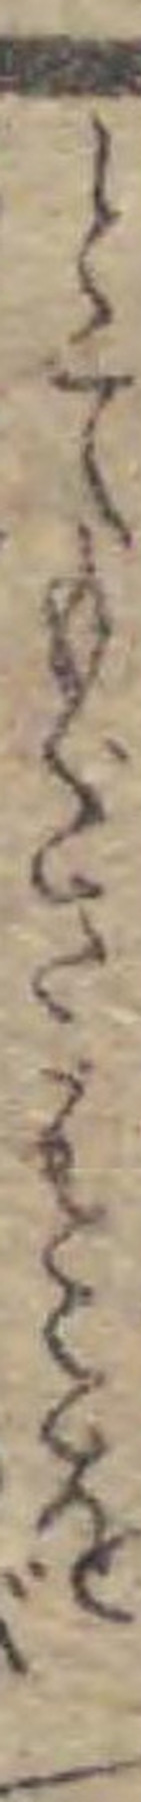とてもぐさはこを
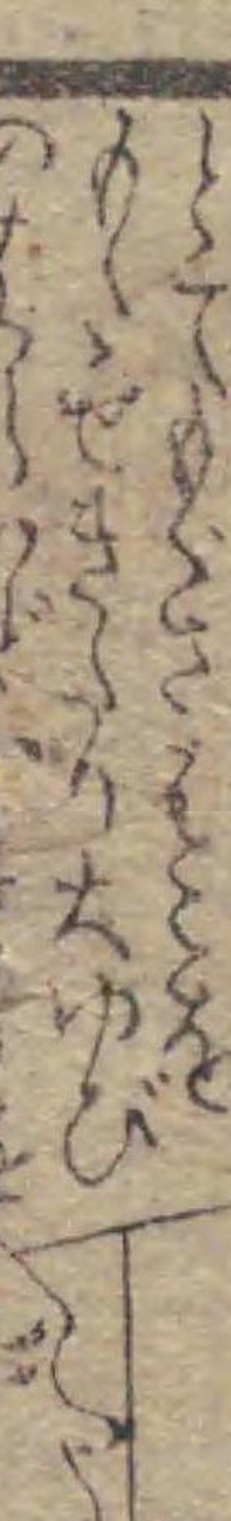もたせきたり大ゆび
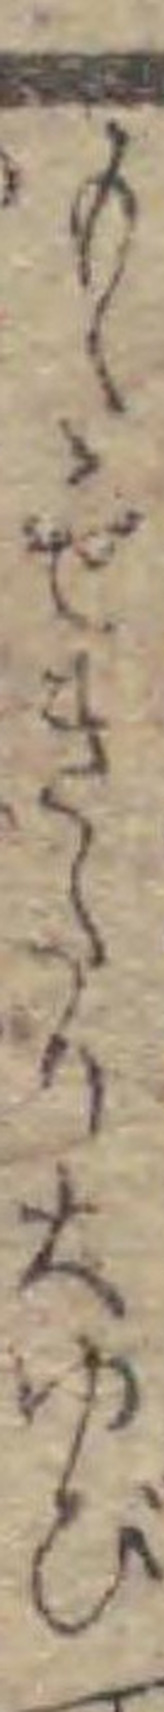もたせきたり大ゆび
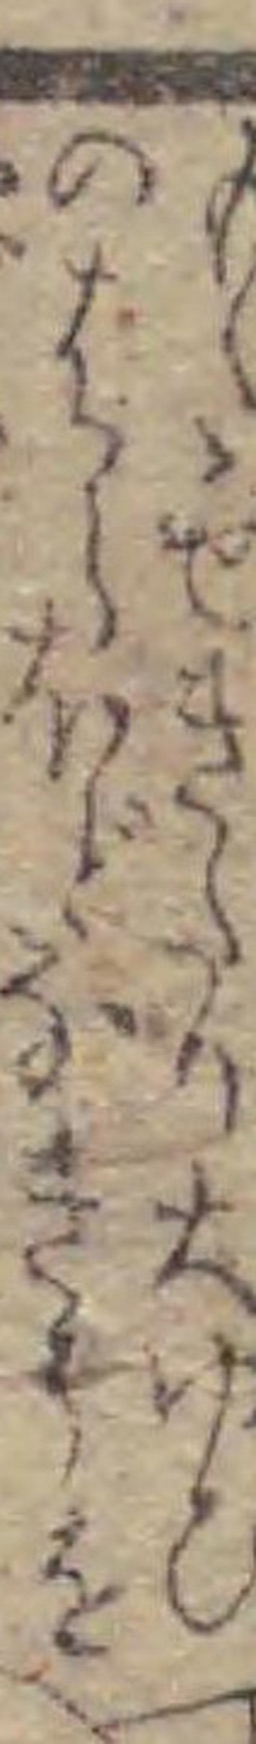のはらほどなきうを
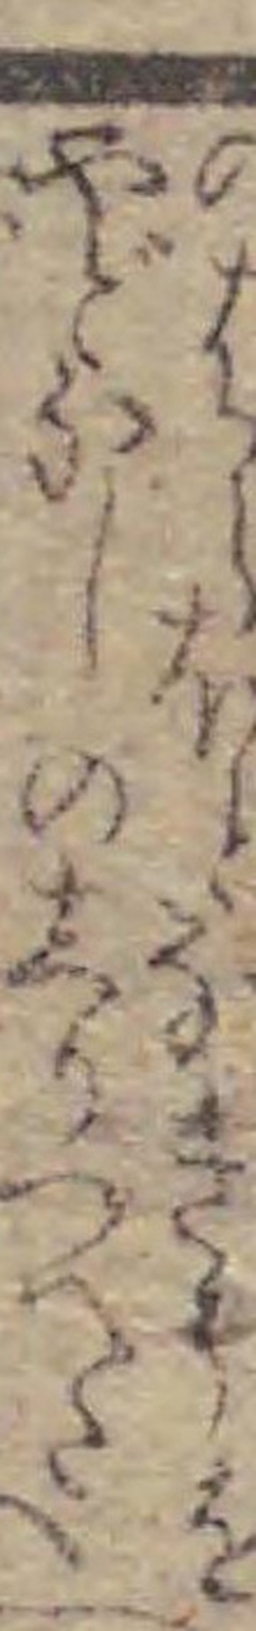やどなしのしりつへたへ
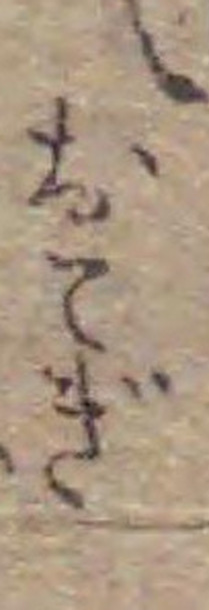おてぎ
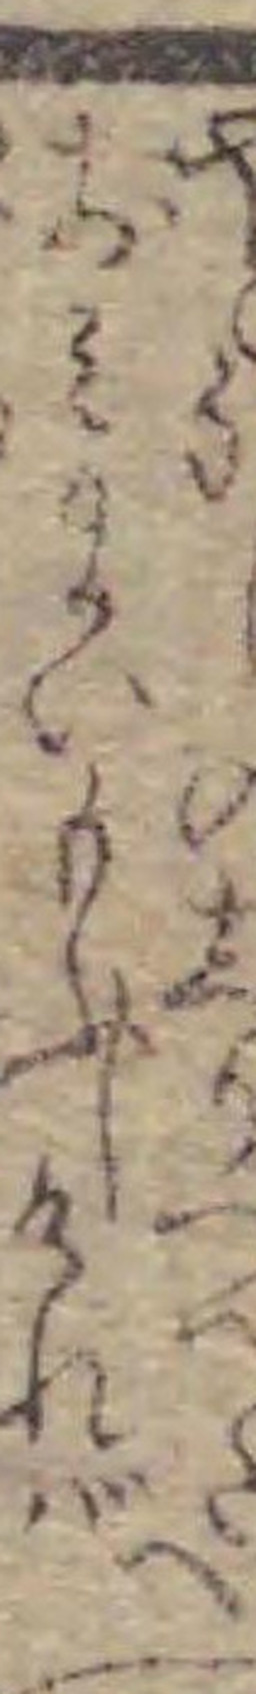おみまいもふしければ
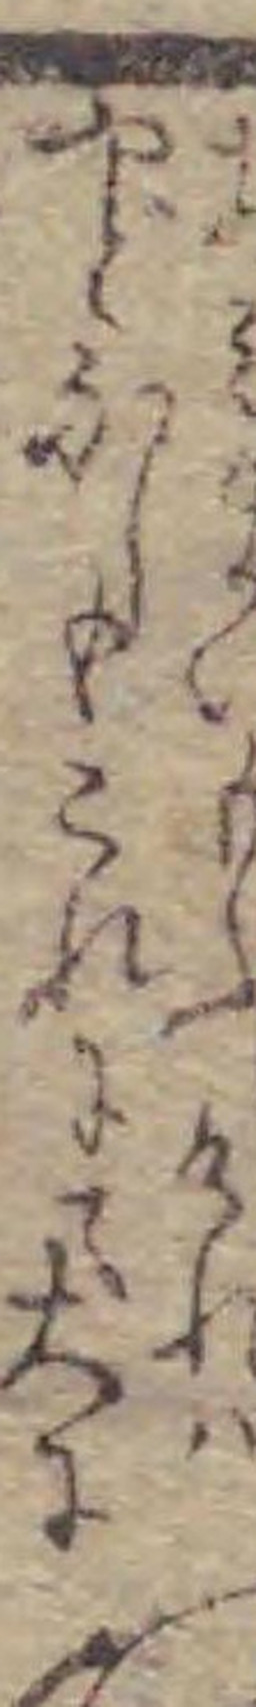やどなしもこれにて大に
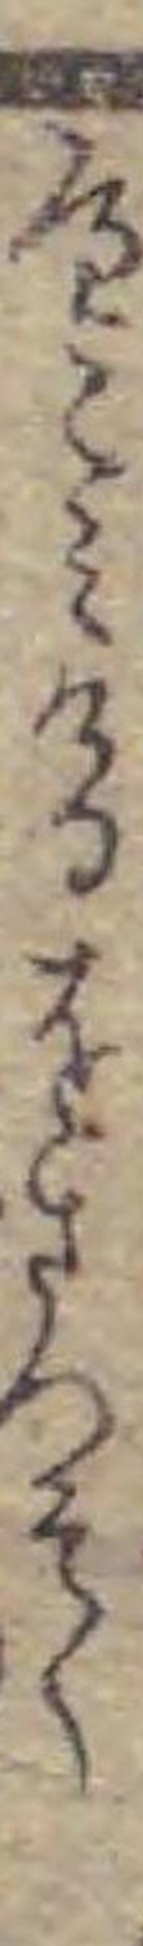へこみけるをさつそく
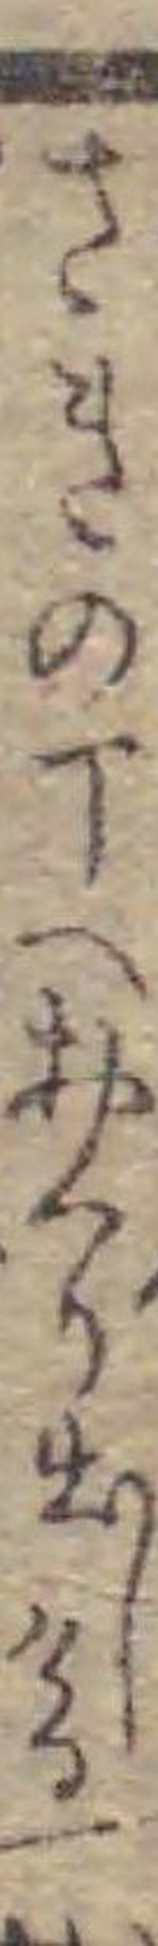さきの丁へおくり出しける
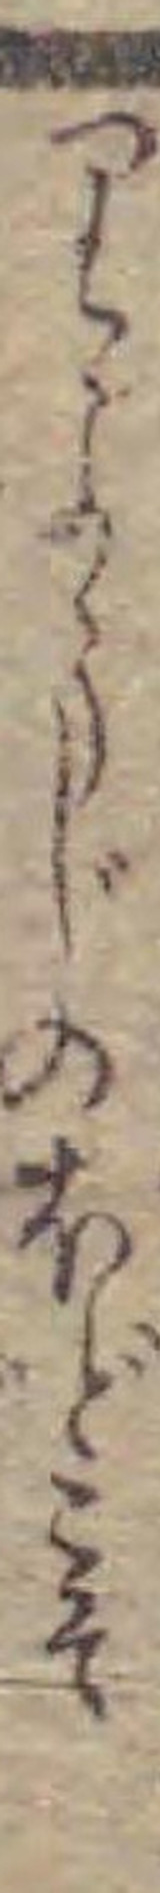りようじのほどこそ
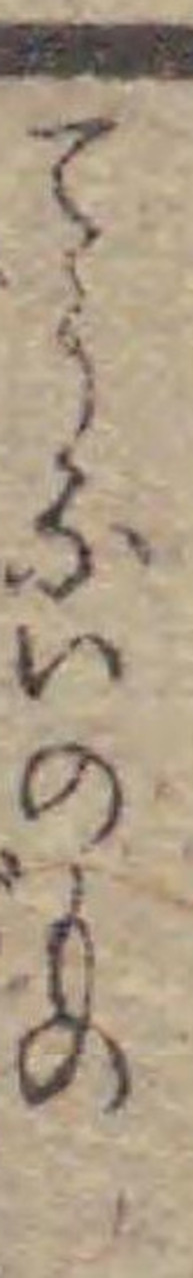てうないのもの
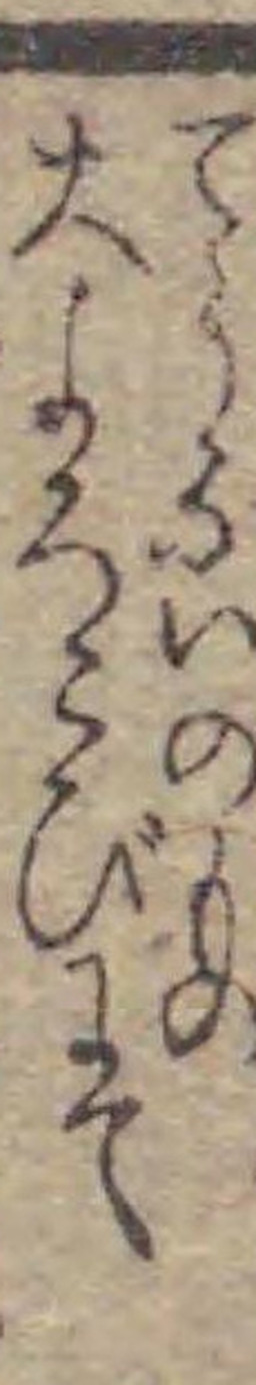大よろこびにて
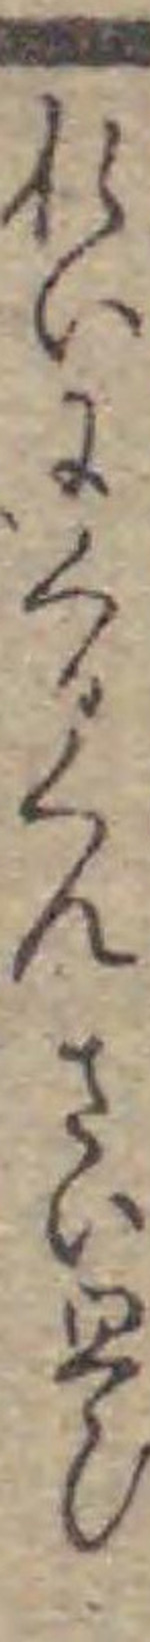れいにくるくんさい思ひ
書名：江戸花俳優贔屓 : 3巻
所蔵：国立国会図書館 National Diet Library, JAPAN
